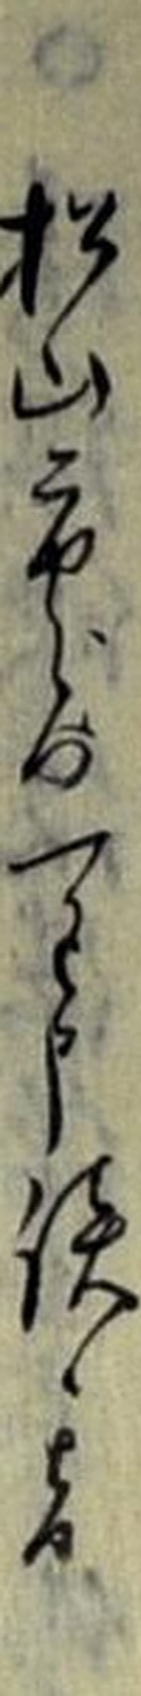松山市郎右衛門可被申談候旨
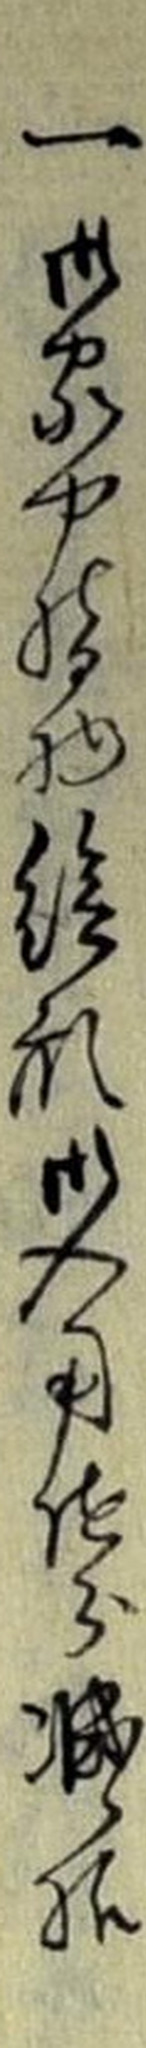一御家中指物絵形御入用随分減候様
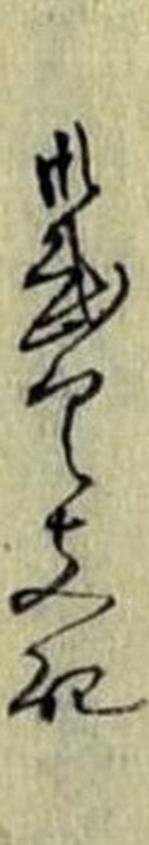御武具支配
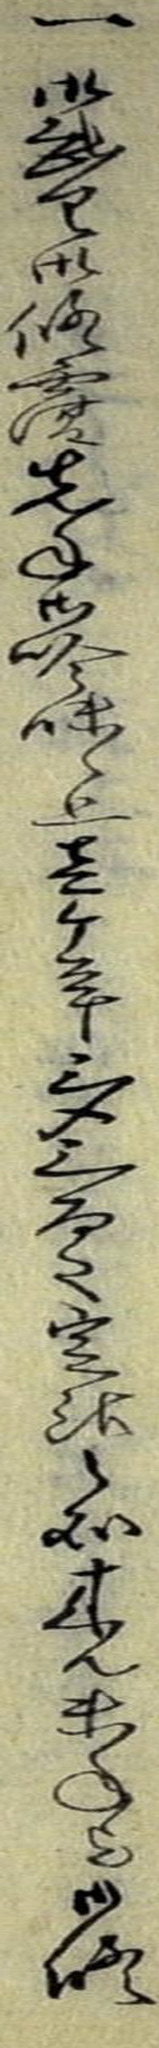一御武具御修覆先年御吟味之上壱ヶ年三貫三百匁定銀之処来る未年迄御修
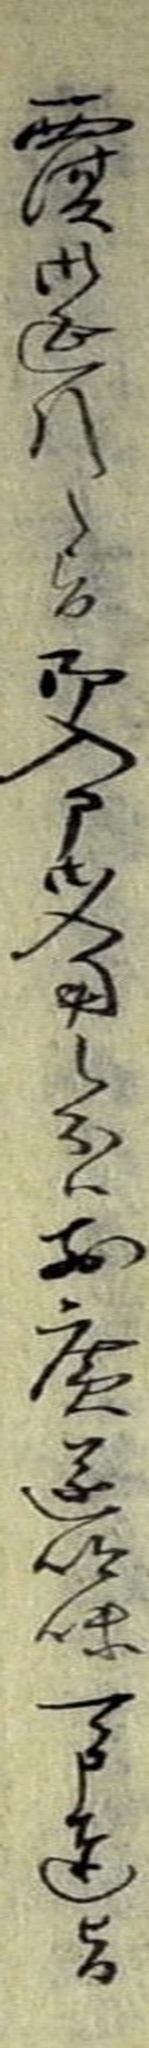覆御延引之旨御入部御入用之分は前広遂吟味可申達旨
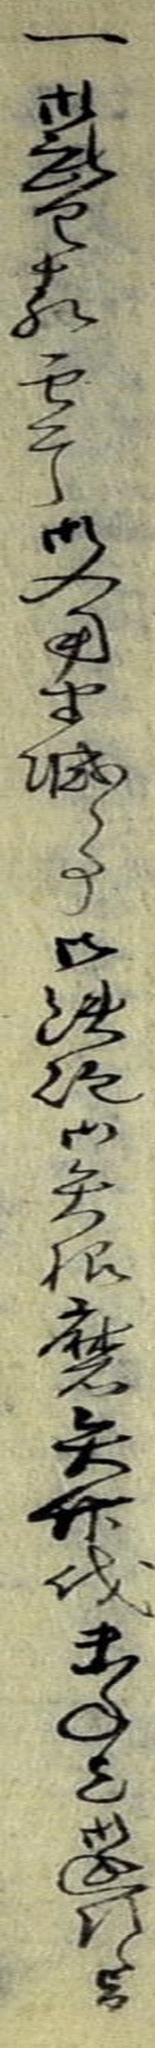一御武具類虫干御入用半減之事御鉄炮御矢根磨矢竹伐未年迄御延引之旨
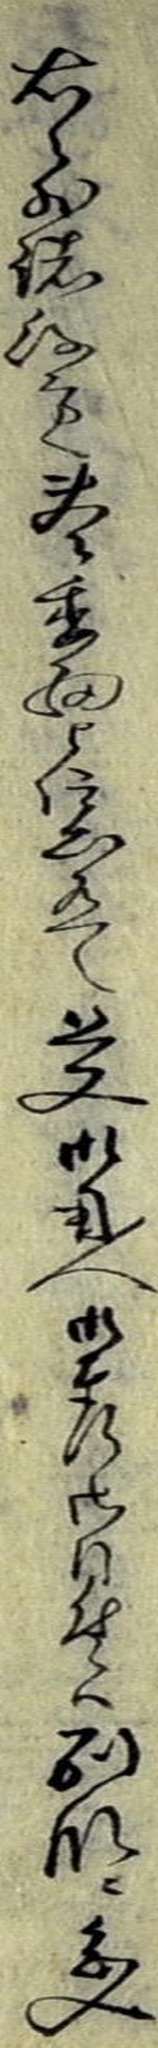右之外諸役方へ夫々委細被仰出有之且又御用人御奉行御目付へは別段に念入
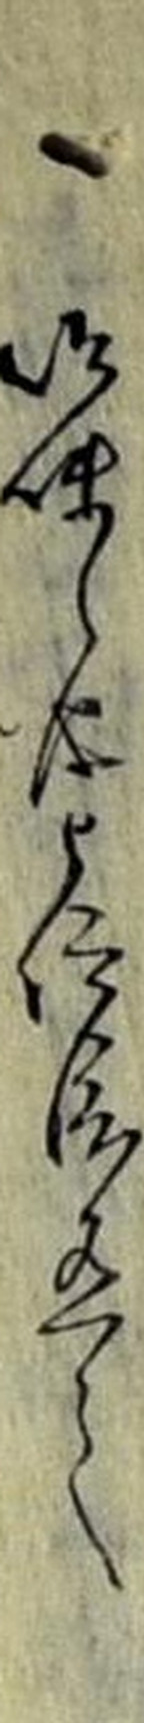吟味之儀被仰渡有之
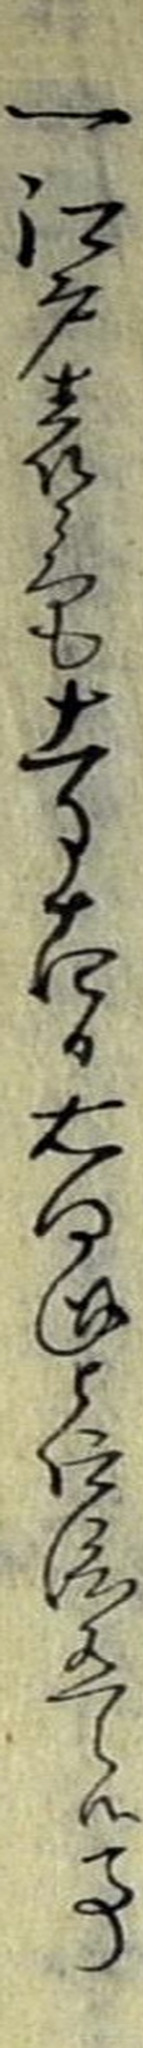一江戸表に而も十一月十四日右同趣被仰渡有之候事
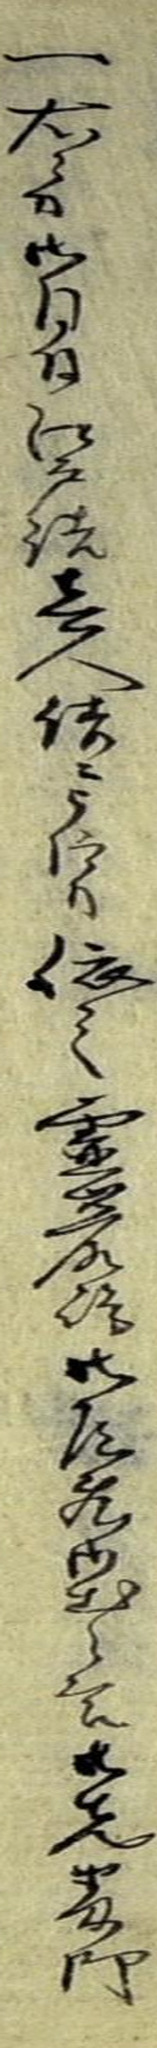一右に付御目付江戸詰壱人詰に被仰付依霊厳嶋御屋敷御出之節御先番御
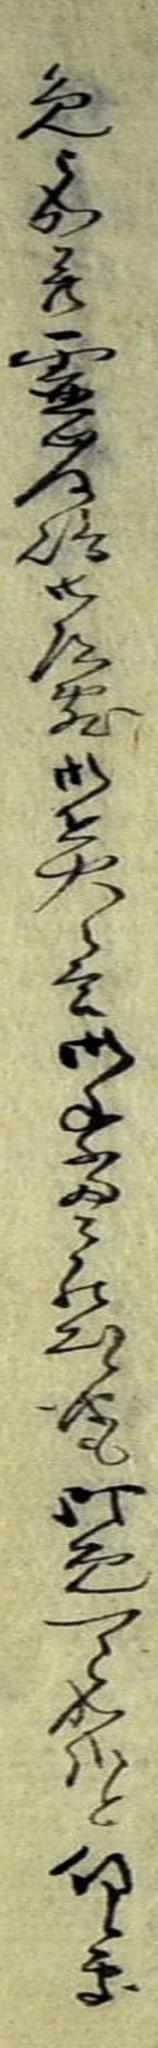免被成并霊厳嶋御屋敷御近火之節御手当に罷出候儀も御免可被成哉と伺候処

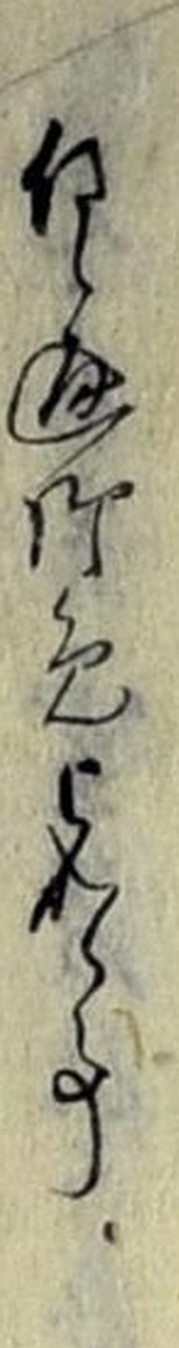伺之通御免被成候事
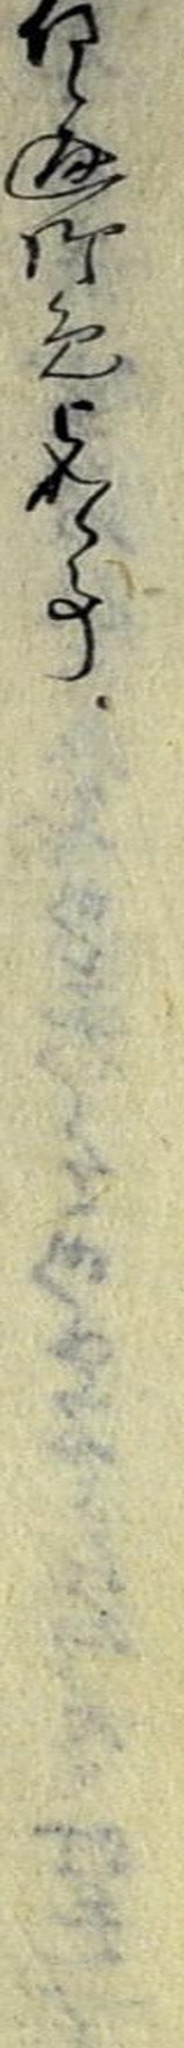伺之通御免被成候事
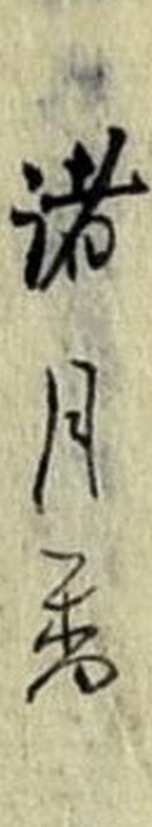諸月番
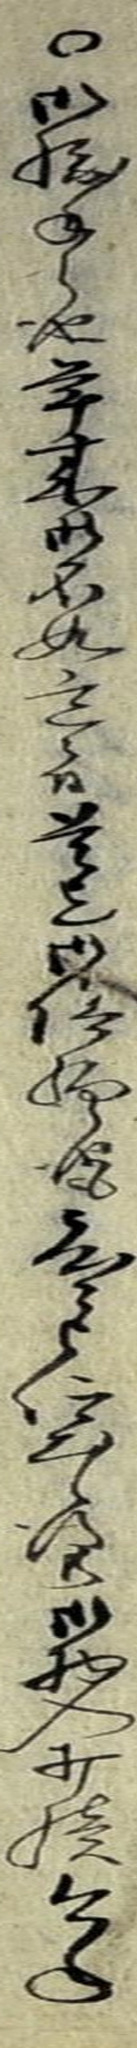〇御勝手之儀年来御不如意に付是迄御倹約之儀も度々被仰出候得共御物入打続今年
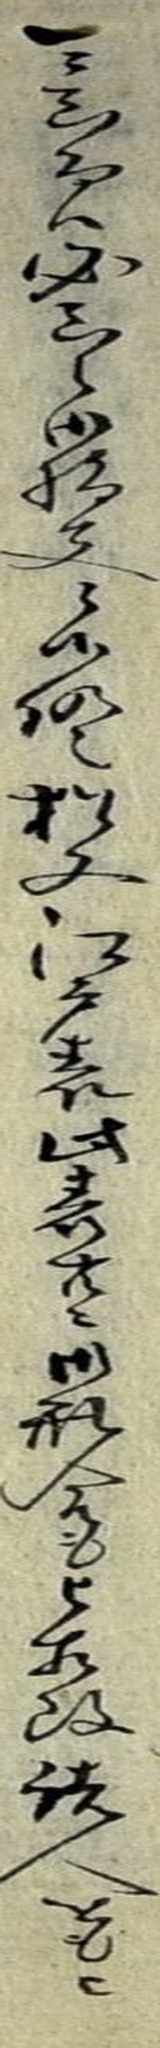に至而は必至之御指支に候仍之猶又江戸表此表共に御形合も被相改詰人をも被
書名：命令之部 二
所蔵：福井県文書館 Fukui Prefectural Archives
